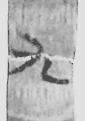九
